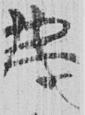弗
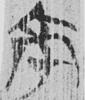京
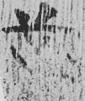必
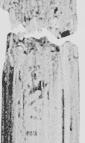○（復）
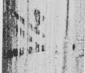之
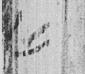㠯（以）
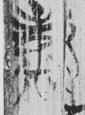康
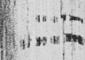上
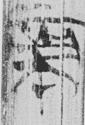帝
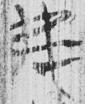弗
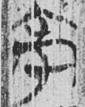京
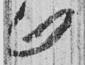㠯（以）
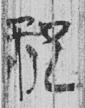祀
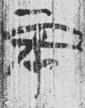不
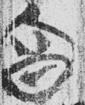亯（享）
